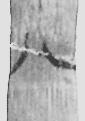八
